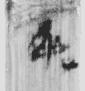身
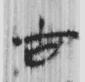古
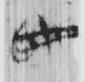母
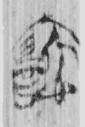{宀糸言斤心}
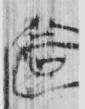甚
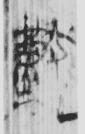{堇攴}
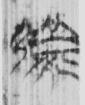備
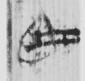母
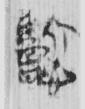{幺言斤心}
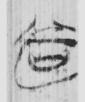甚
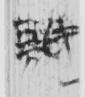{女𡵂}
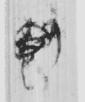飤
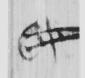母
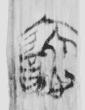{宀糸言斤心}
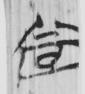甚
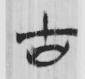古
